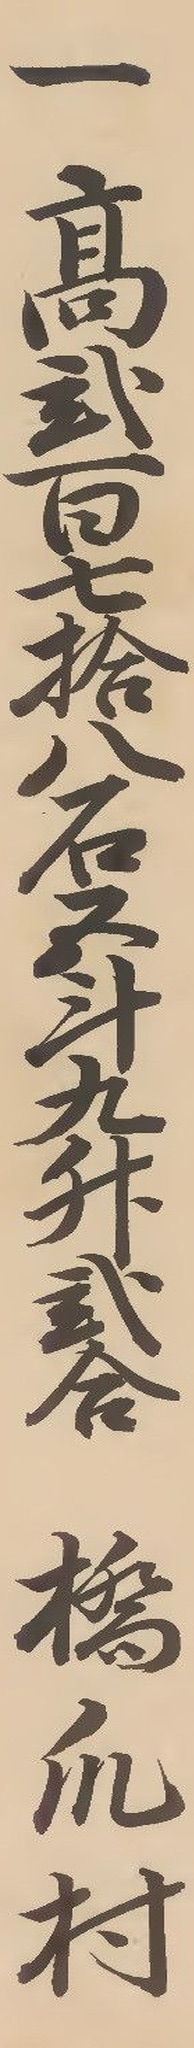一高弐百七拾八石五斗九升弐合橋爪村

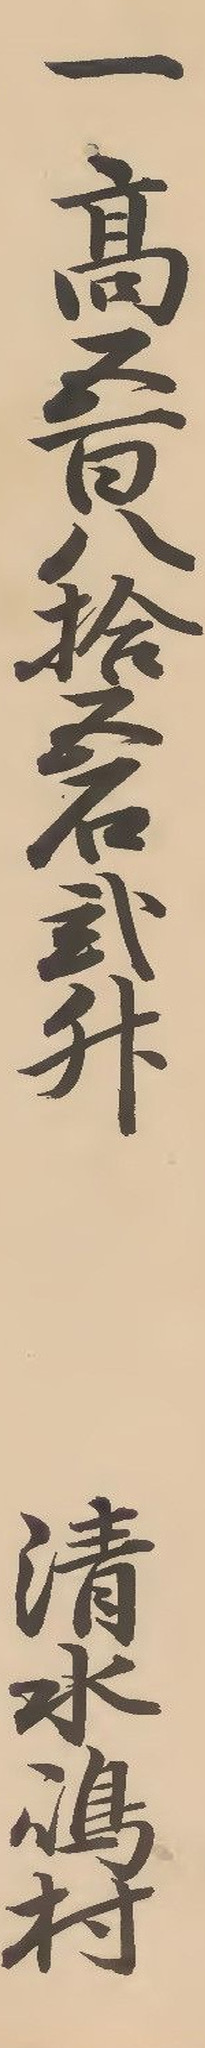一高五百八拾五石弐升清水島村
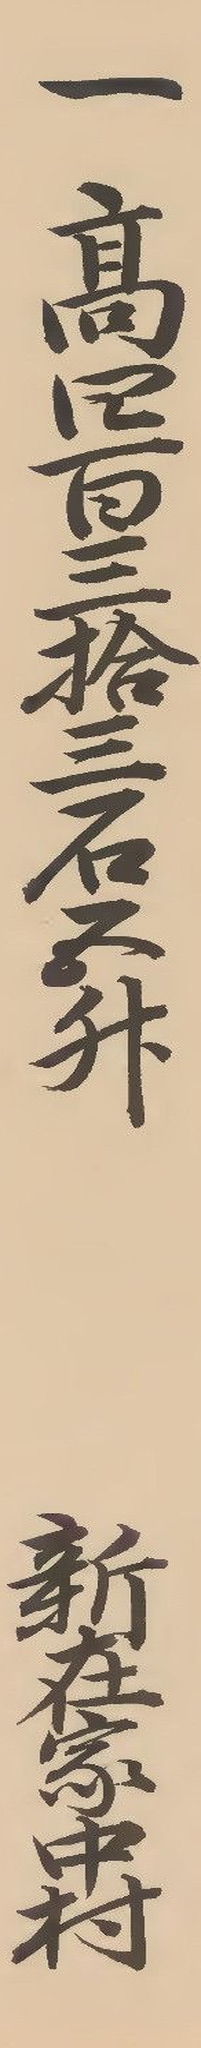一高四百三拾三石五升新在家中村
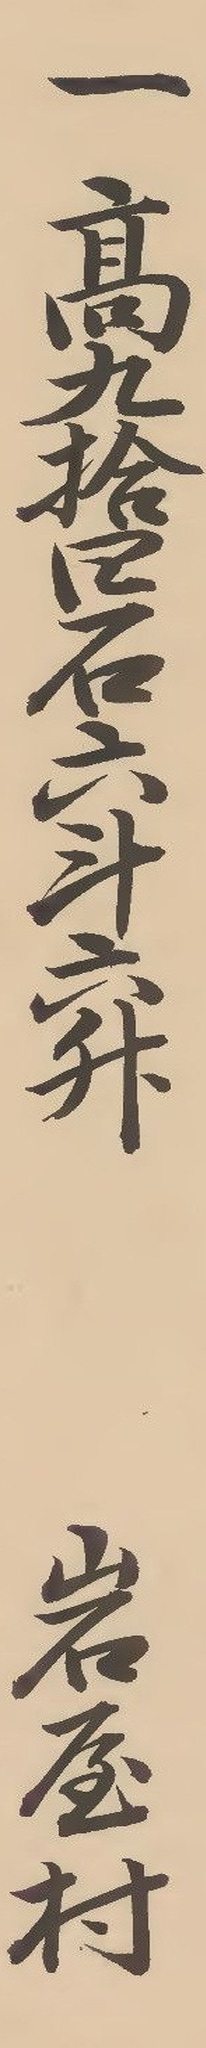一高九拾四石六斗六升岩屋村
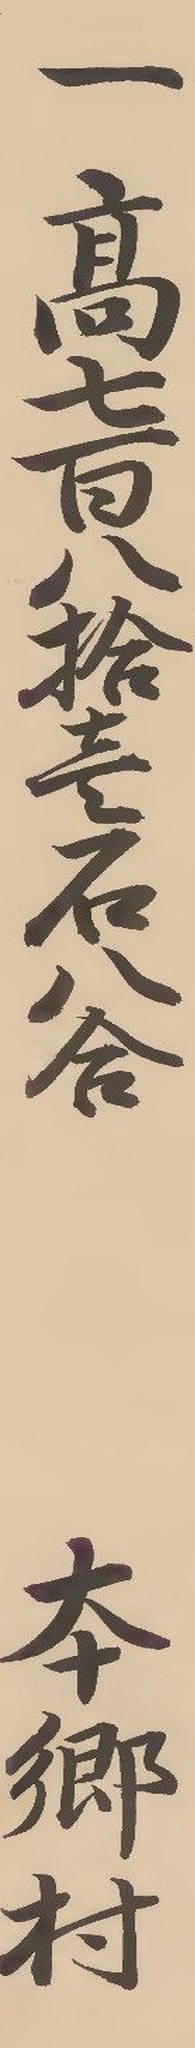一高七百八拾壱石八合本郷村
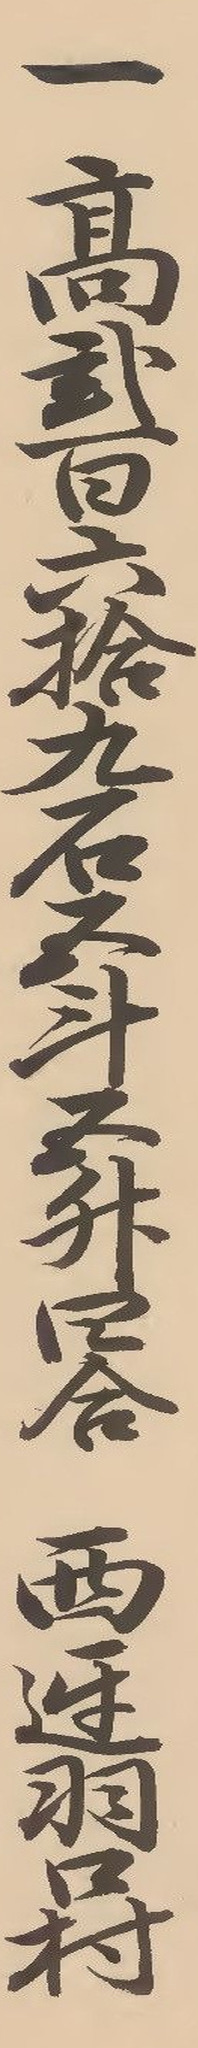一高弐百六拾九石五斗五升四合西遅羽口村
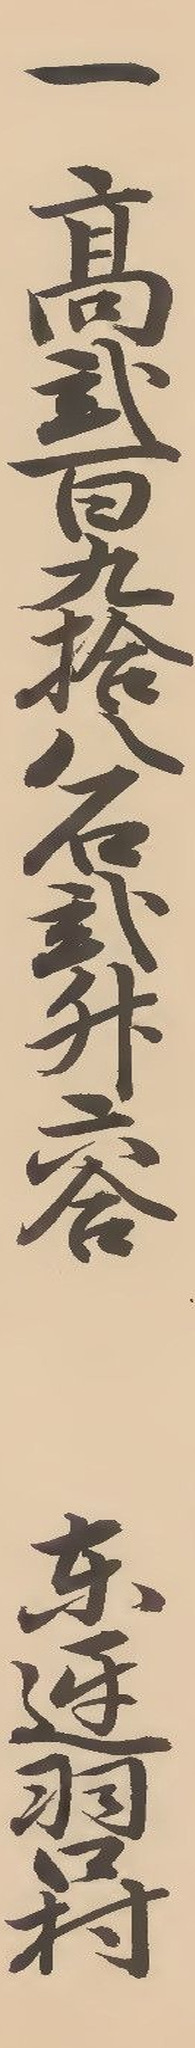一高弐百九拾八石弐升六合東遅羽口村
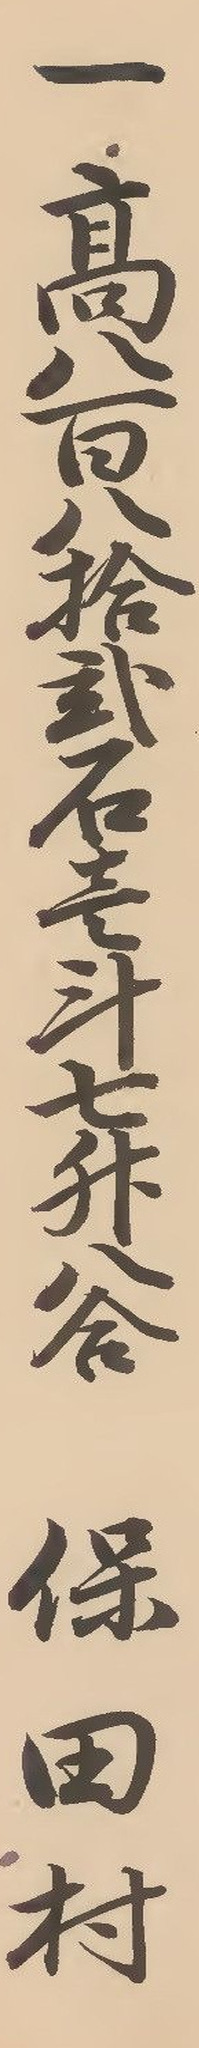一高八百八拾弐石壱斗七升八合保田村

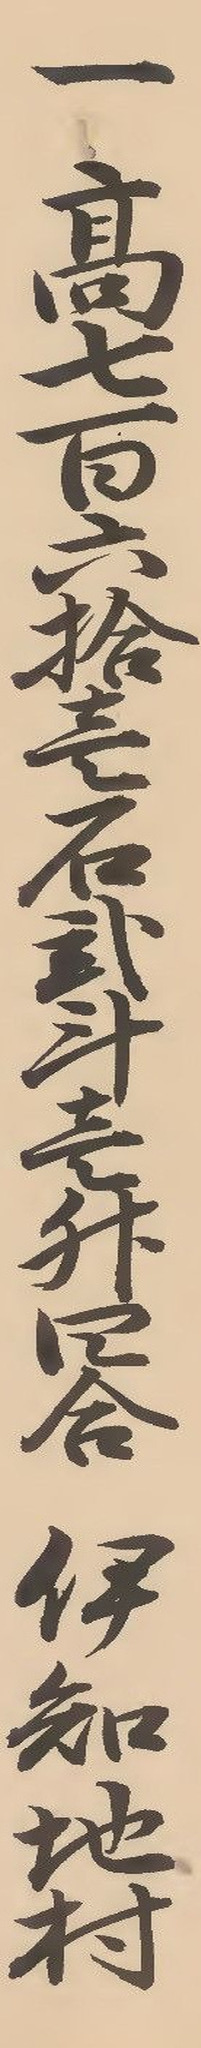一高七百六拾壱石弐斗壱升四合伊知地村
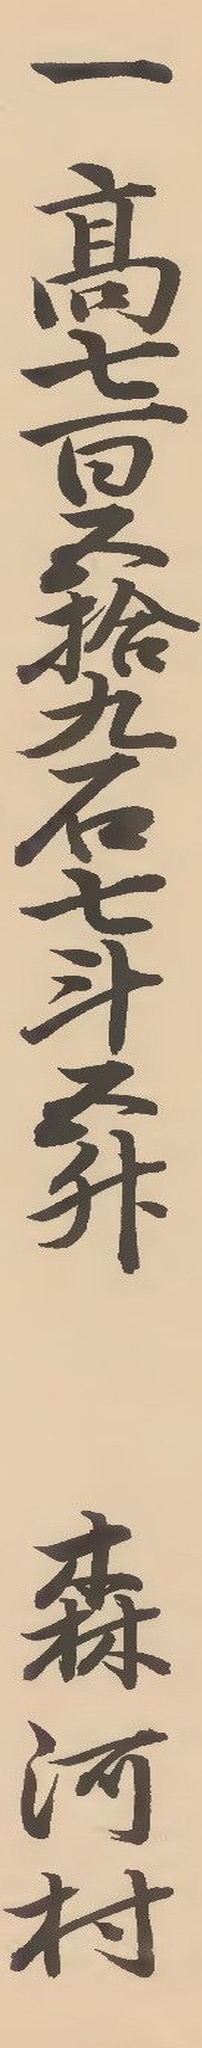一高七百五拾九石七斗五升森河村
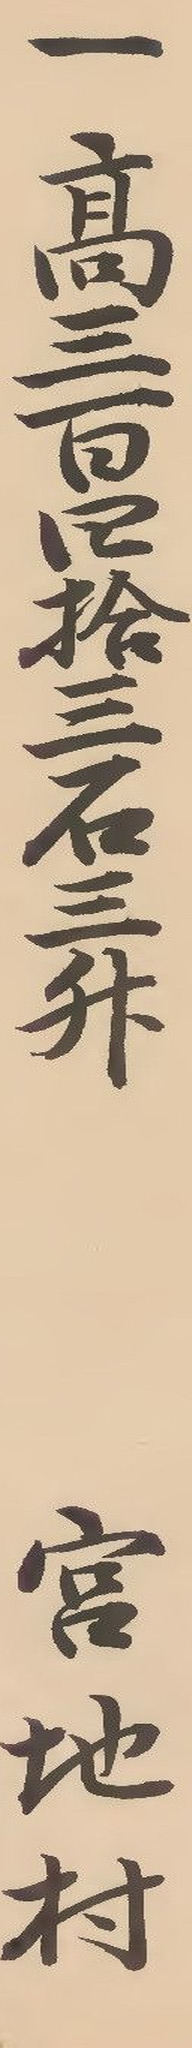一高三百四拾三石三升宮地村
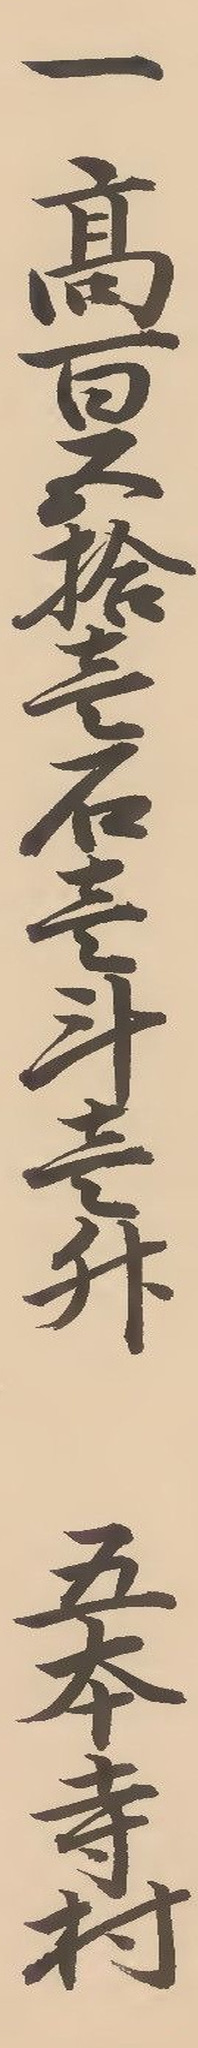一高百五拾壱石壱斗壱升五本寺村
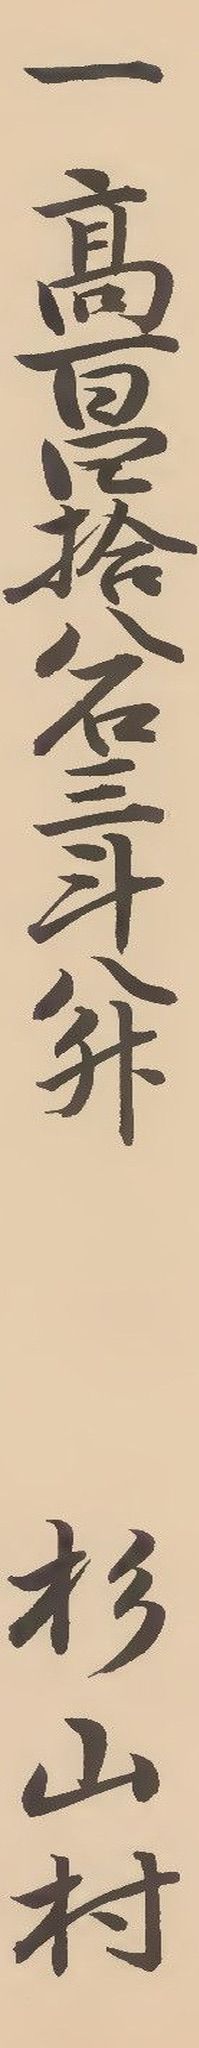一高百四拾八石三斗八升杉山村
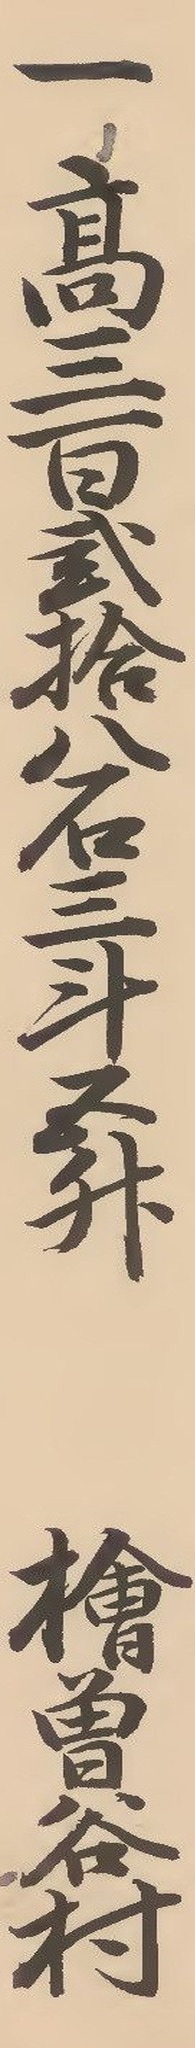一高三百弐拾八石三斗五升桧曽谷村

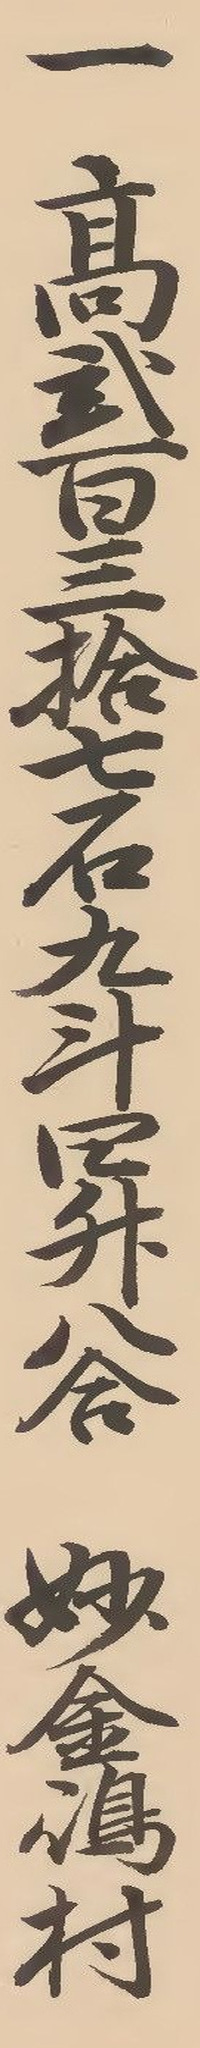一高弐百三拾七石九斗四升八合妙金島村

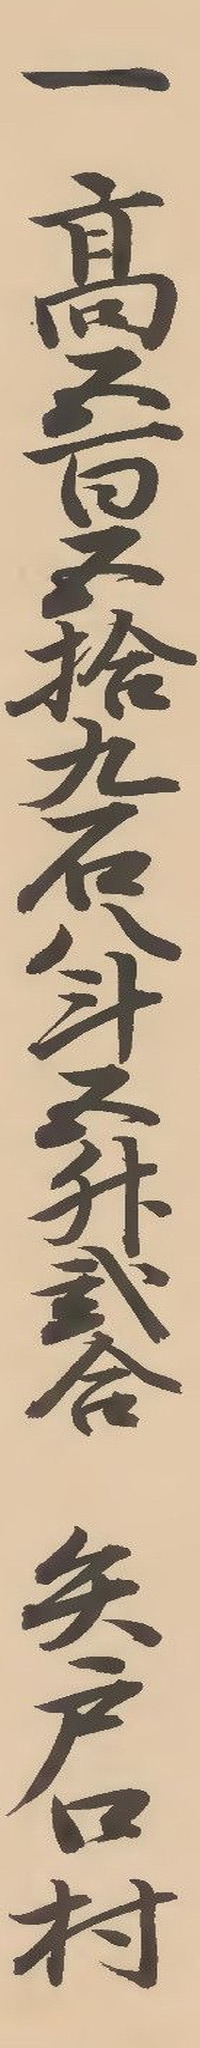一高五百五拾九石八斗五升弐合矢戸口村
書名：越前国郷帳
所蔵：国立公文書館 National Archives of Japan
